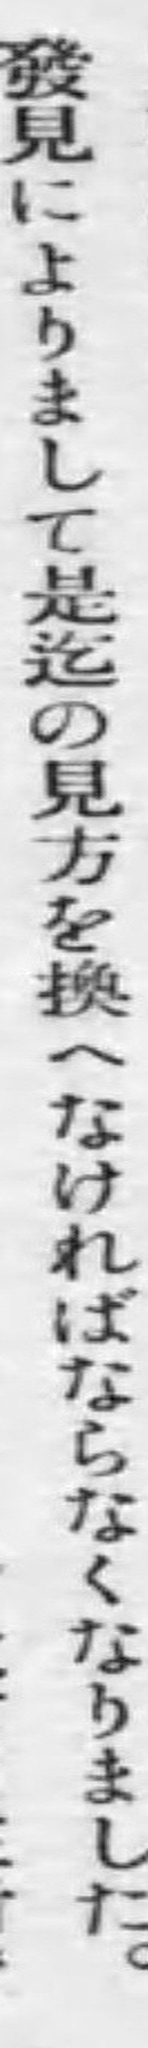發見によりまして是迄の見方を換へなければならなくなりました。
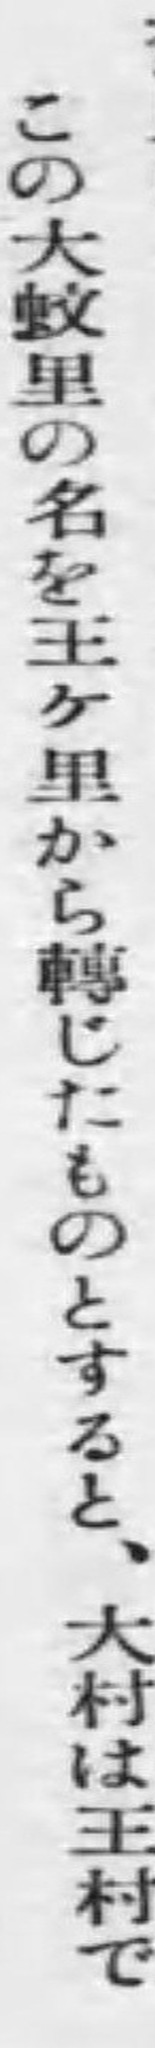この大蚊里の名を王ヶ里から轉じたものとすると、大村は王村で
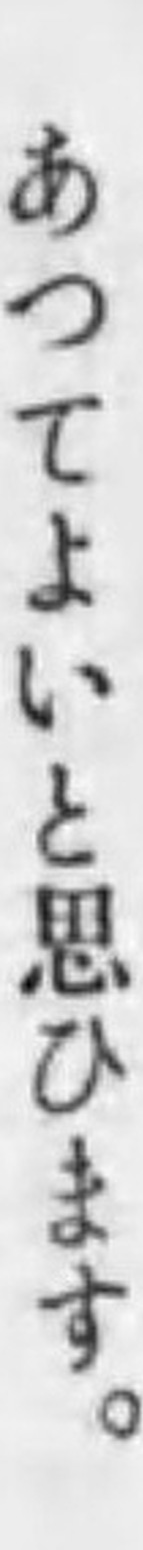あつてよいと思ひます。
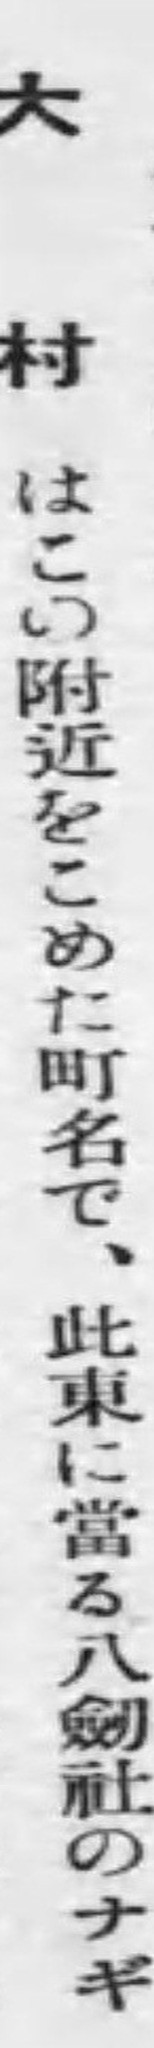大村はこの附近をこめた町名で、此東に當る八劒社のナギ
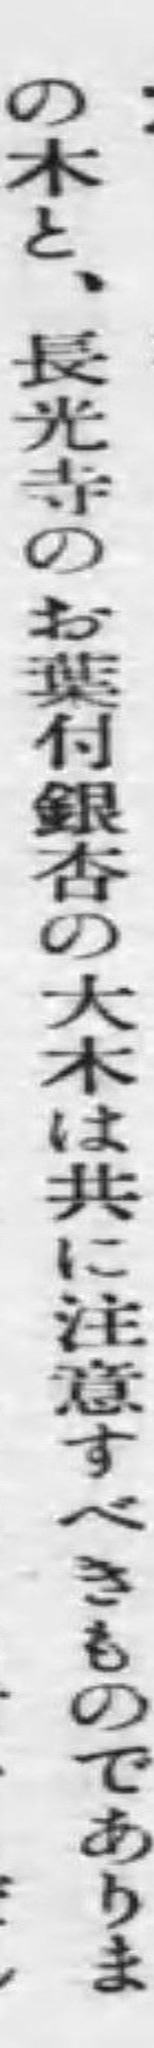の木と、長光寺のお葉付銀杏の大木は共に注意すべきものでありま
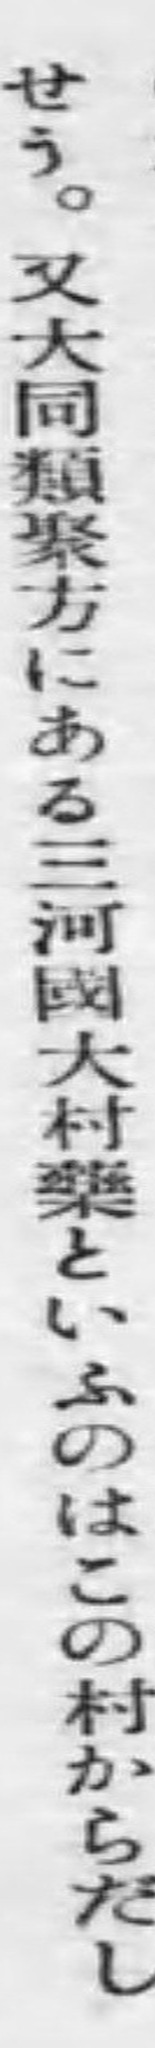せう。又大同類聚方にある三河國大村藥といふのはこの村からだし
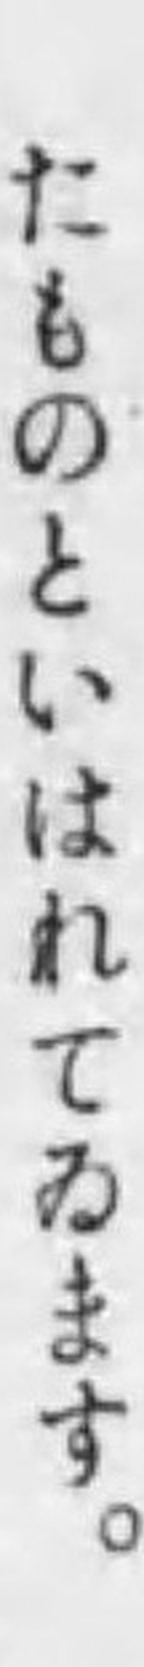たものといはれてゐます。
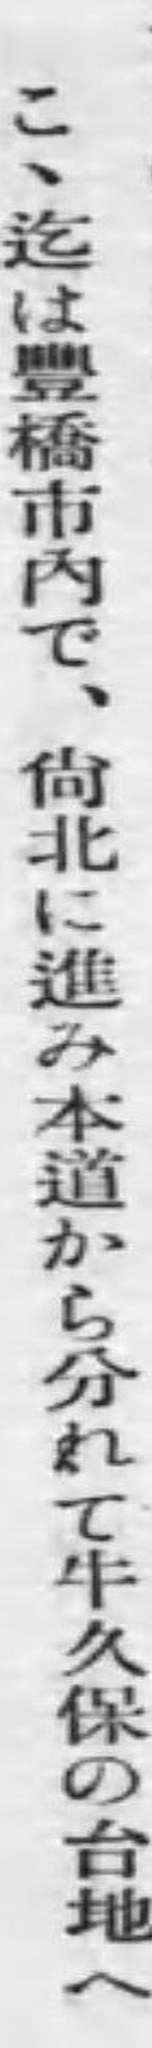こヽ迄は豊橋市内で、尚北に進み本道から分れて牛久保の台地へ
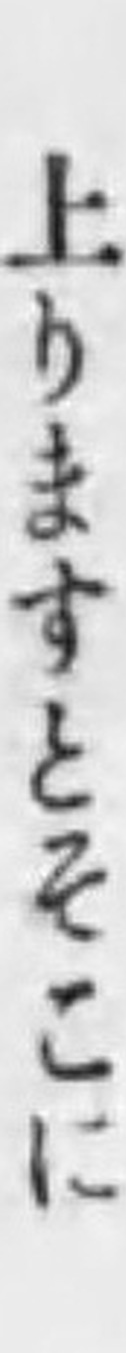上りますとそこに
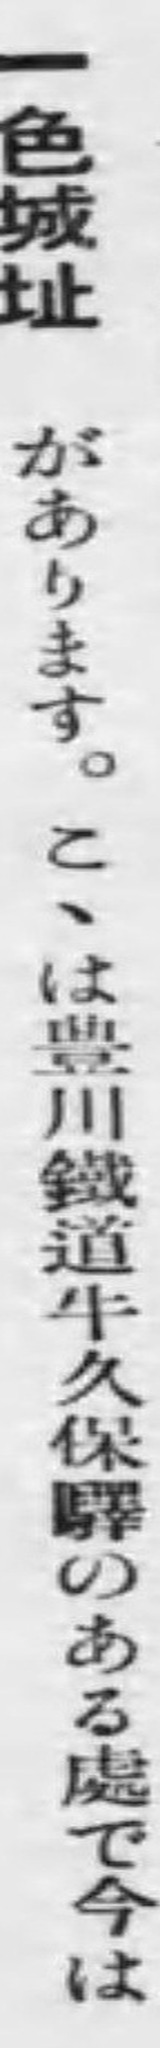一色城址があります。こヽは豊川鐵道牛久保驛のある處で今は
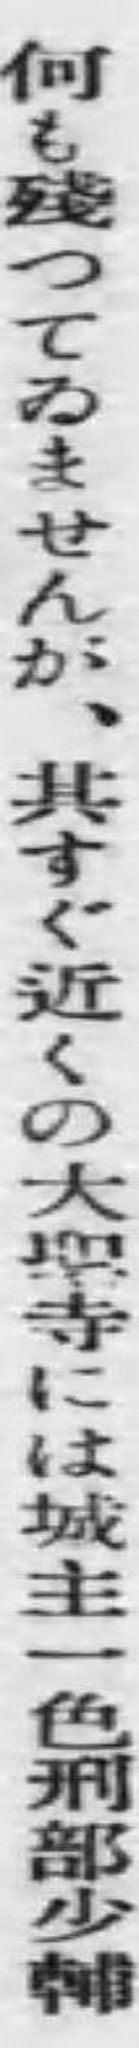何も殘つてゐませんが、其すぐ近くの大聖寺には城主一色刑部少輔
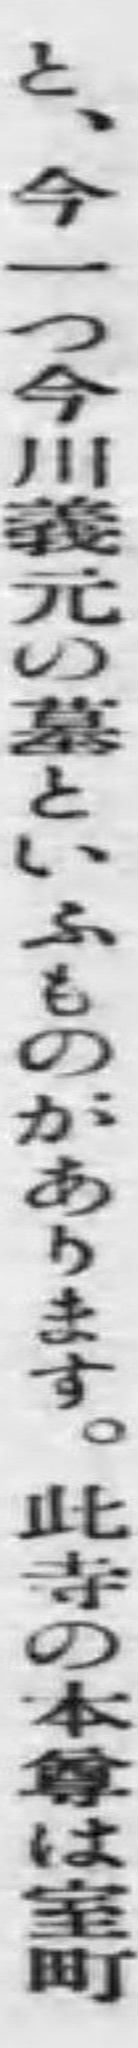と、今一つ今川義元の墓といふものがあります。此寺の本尊は室町
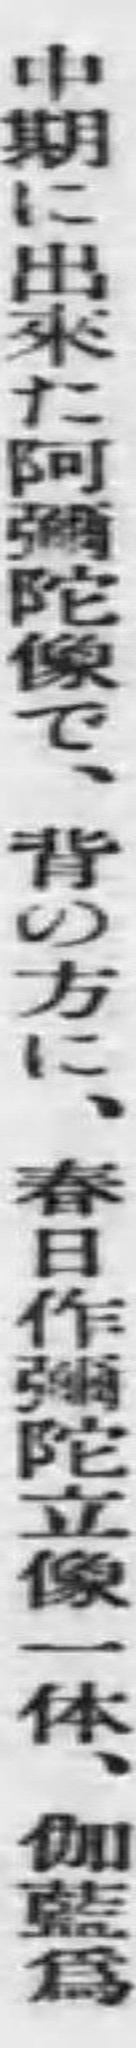中期に出來た阿彌陀像で、背の方に、春日作彌陀立像一体、伽藍為
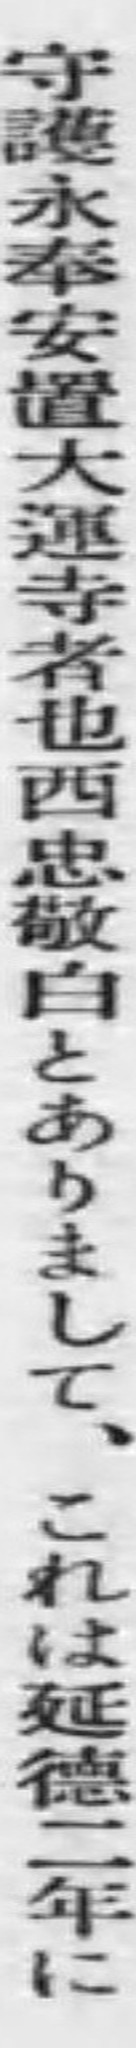守護永奉安置大運寺者也西忠敬白とありまして、これは延徳二年に
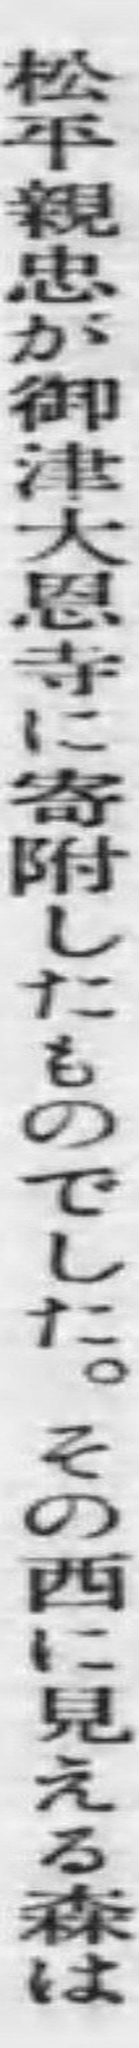松平親忠が御津大恩寺に寄附したものでした。その西に見える森は
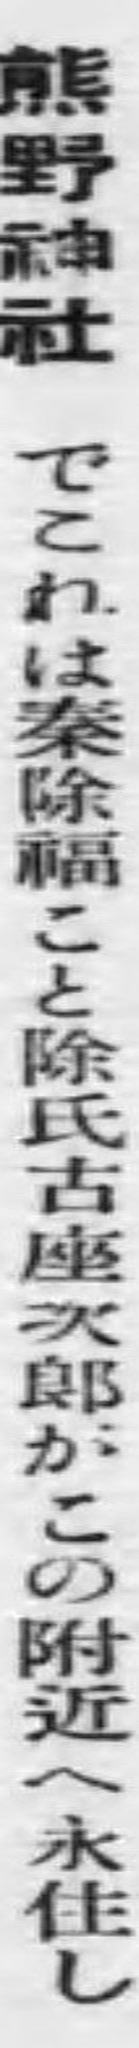熊野神社でこれは秦除福こと除氏古座次郞がこの附近へ永住し
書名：東三河道中記 : 豊橋市及其附近案内
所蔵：国立国会図書館 National Diet Library, JAPAN
